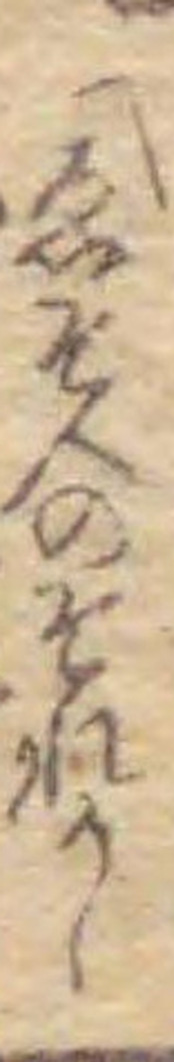〽ゑそ人のそれかし
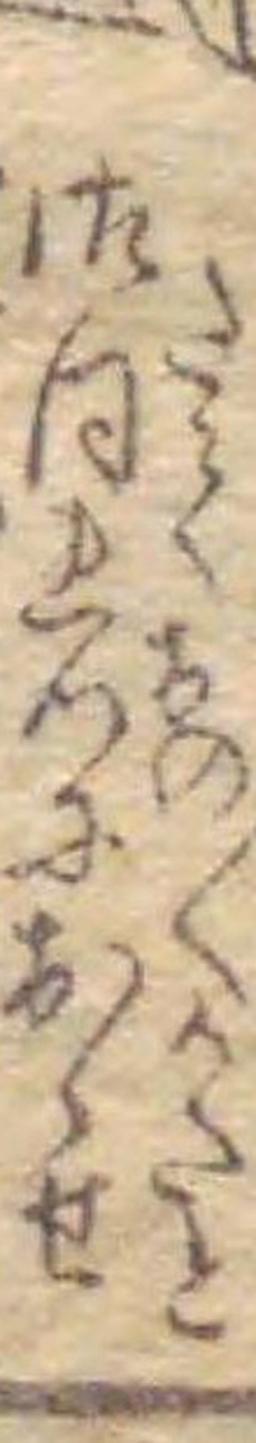御同れつにおゝせ
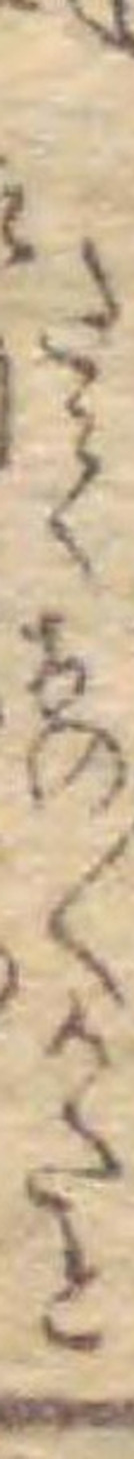たておの〳〵かたと
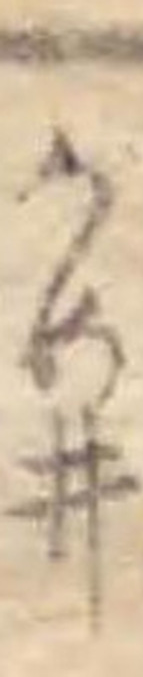かめ井
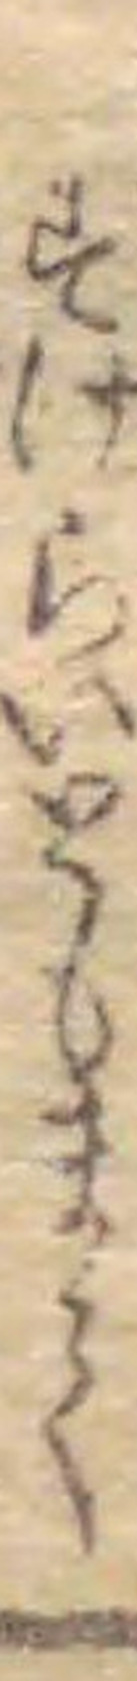すけらいともまた
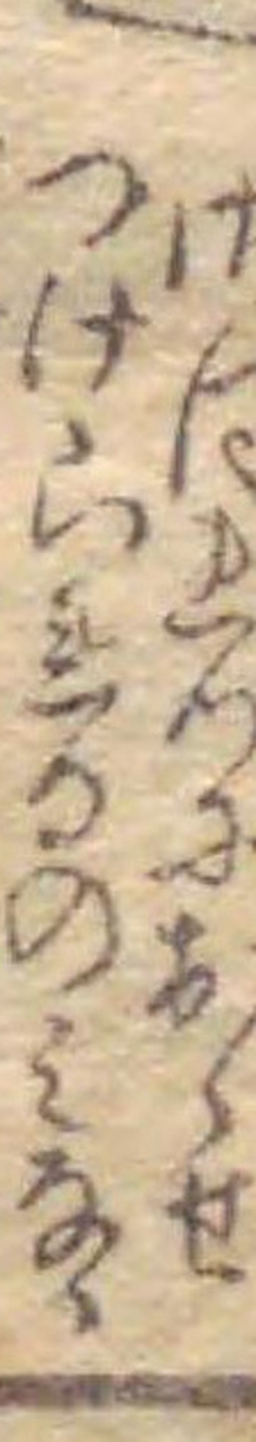つけられるのみなら
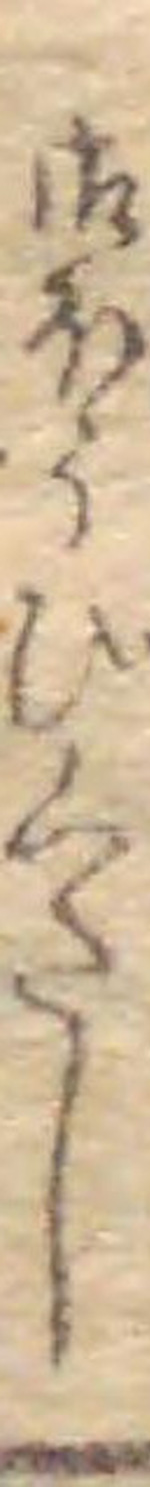御ほうひくたし
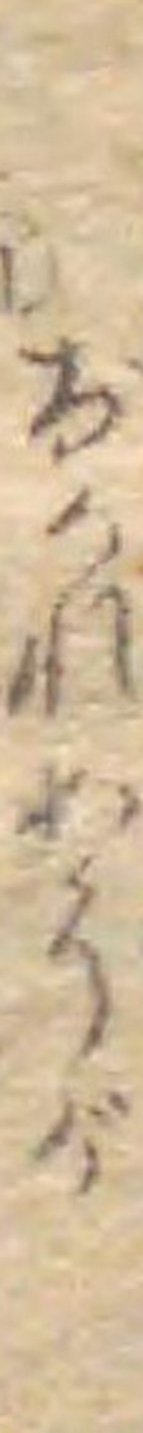おかれめうが
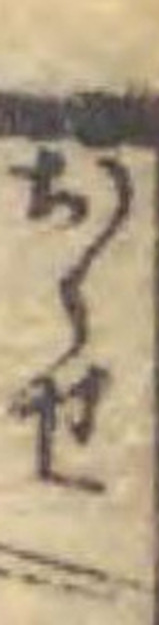おゝせ
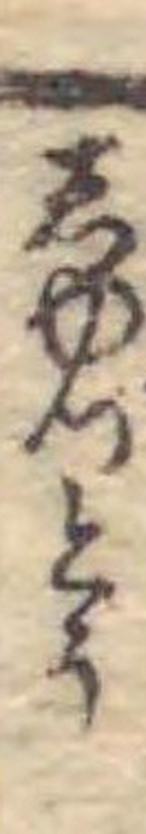しゆつとう
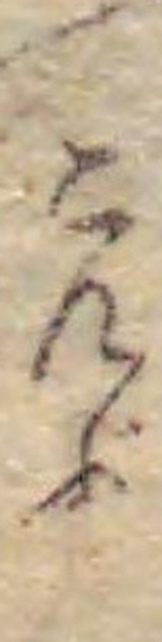こんぶ
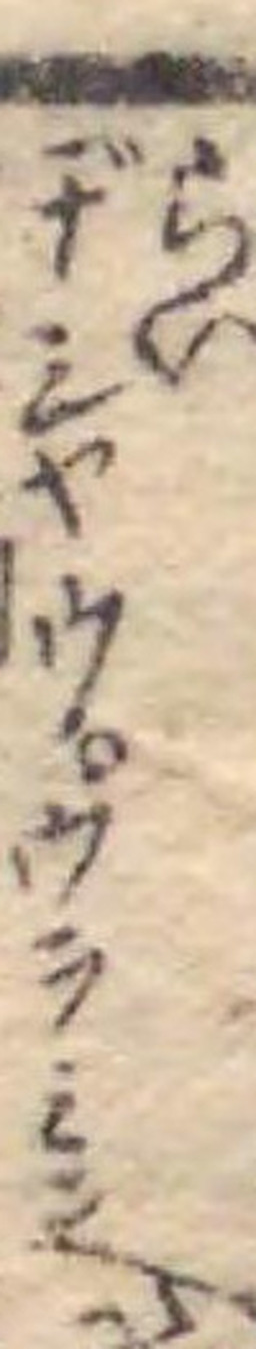ヂンシヤウ。ウラミン
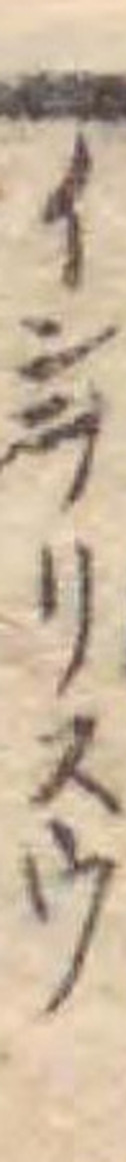インヲリスウ
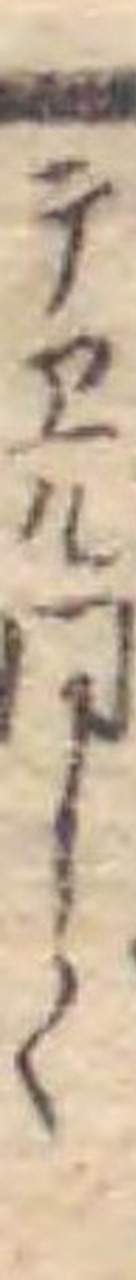テヱル同しく
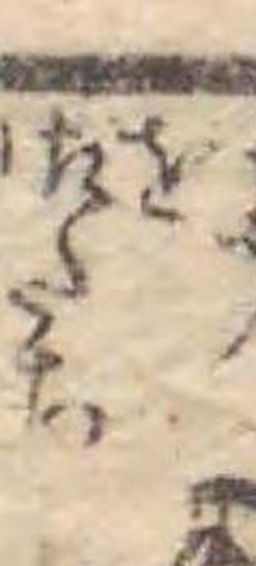御たち
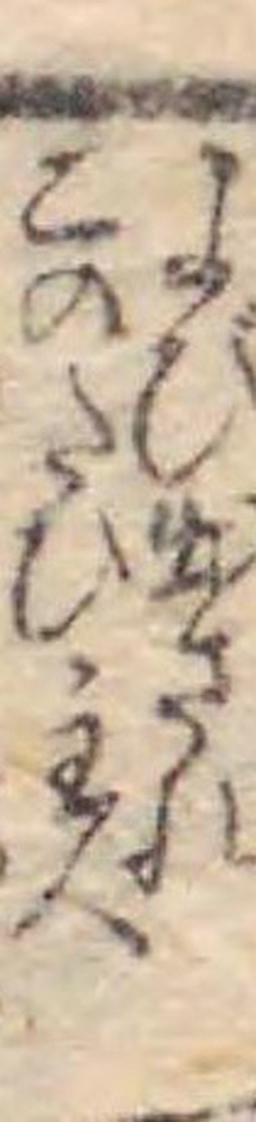このたひ主人
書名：悦贔負蝦夷押領 : 3巻
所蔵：国立国会図書館 National Diet Library, JAPAN
